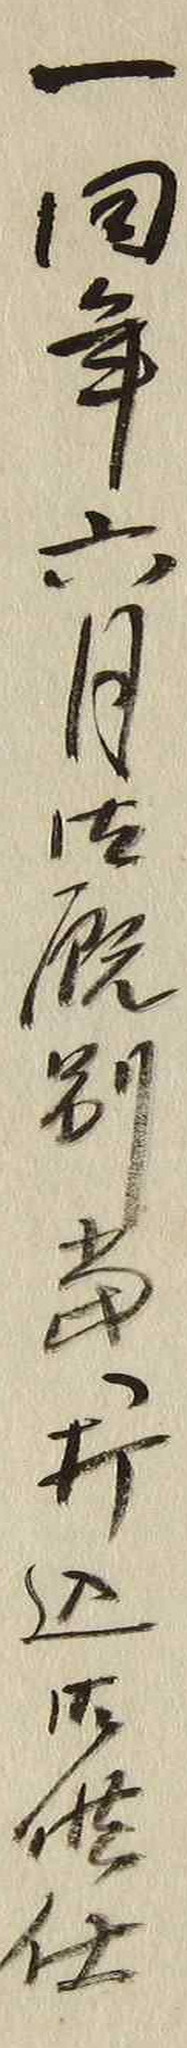一同年六月御厩別当へ打込御供仕
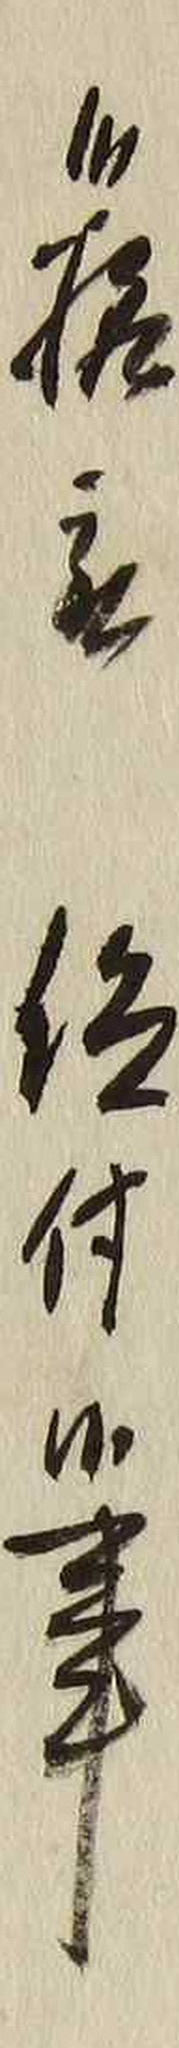候様被仰付候事
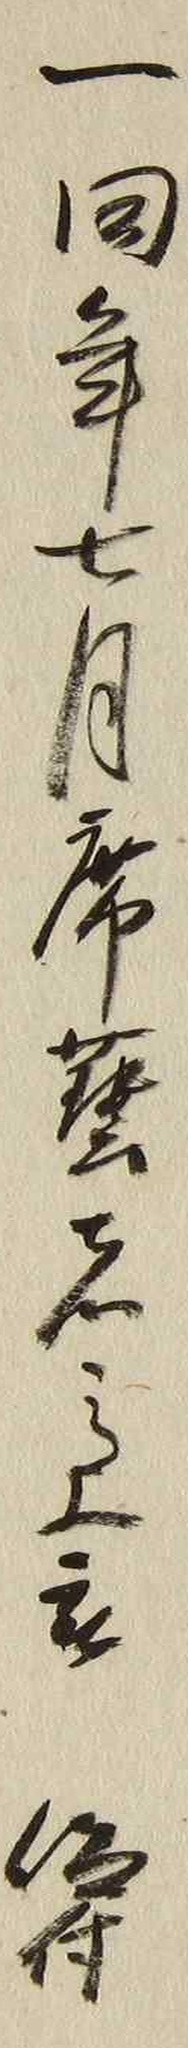一同年七月席芸者之上被仰付
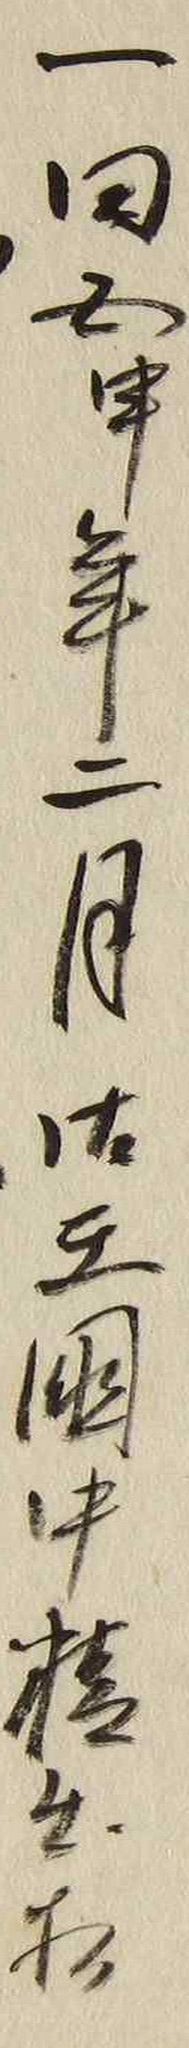一同五申年二月御在国中精出相
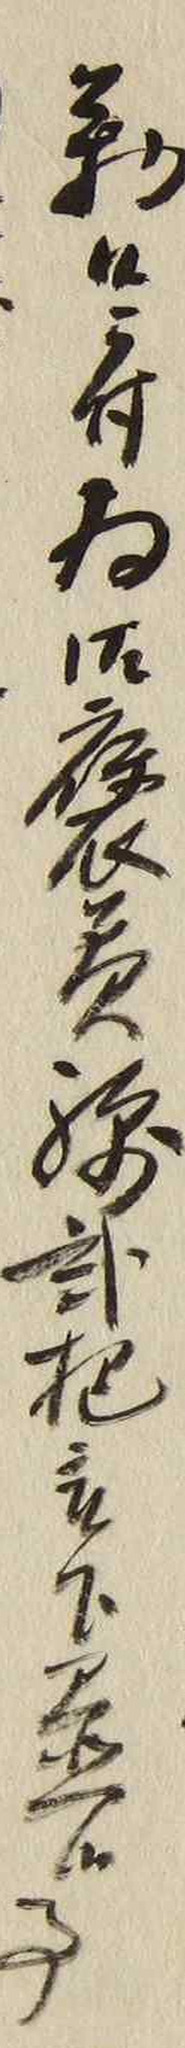勤候に付為御褒美綿弐把被下置候事
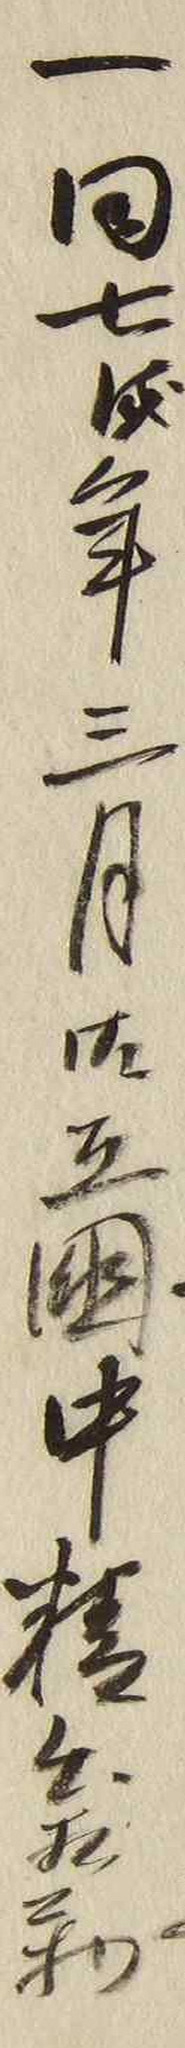一同七年三月御在国中精出相勤

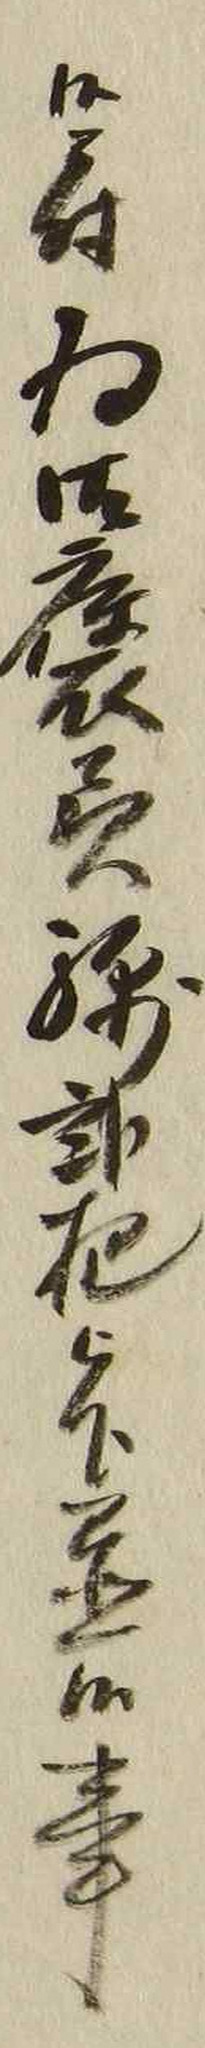候に付為御褒美綿弐把被下置候事
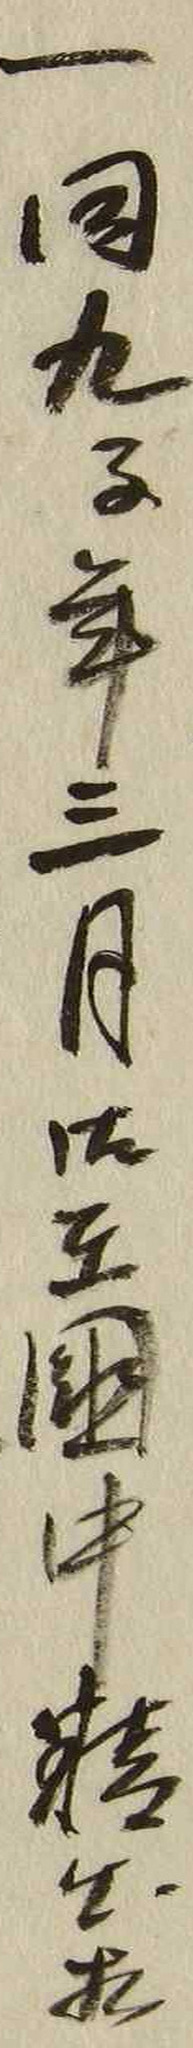一同九子年三月御在国中精出相
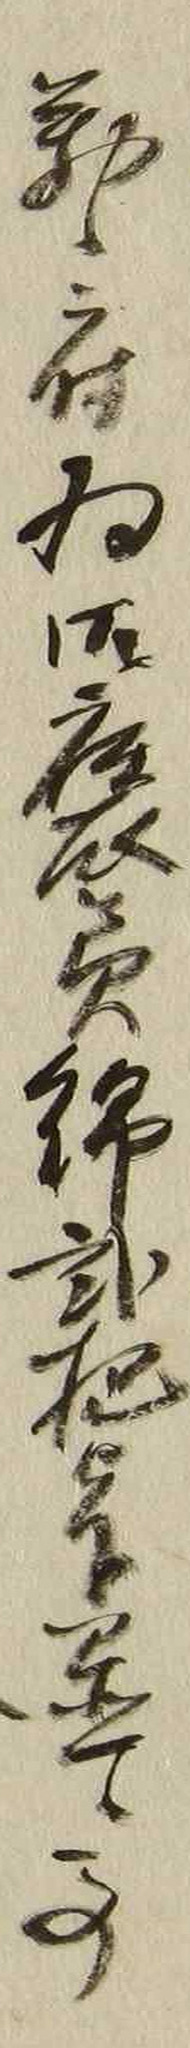勤候に付為御褒美綿弐把被下置候事
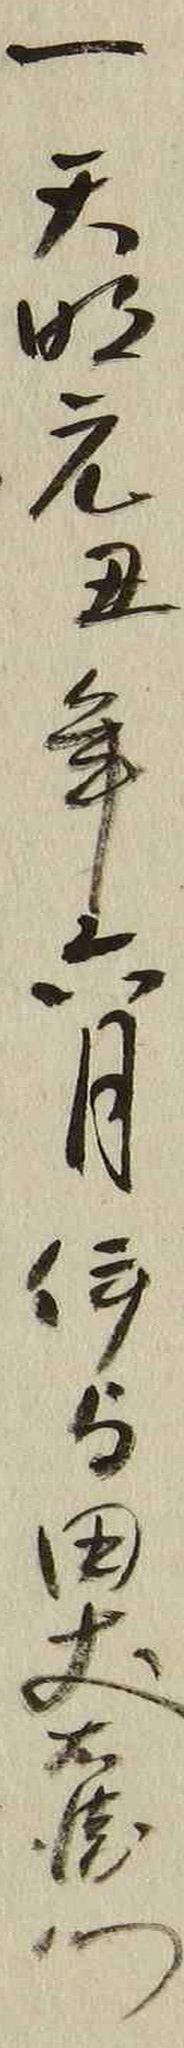一天明元丑年六月伊与田丈右衛門
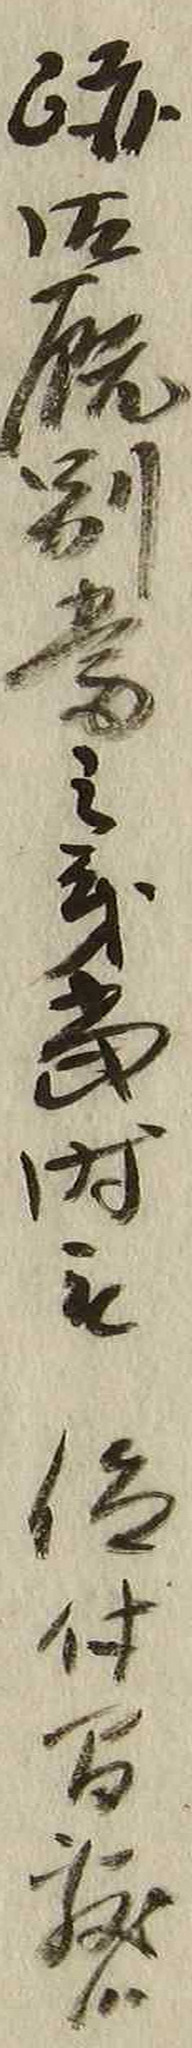跡御厩別当之義当時被仰付間敷候
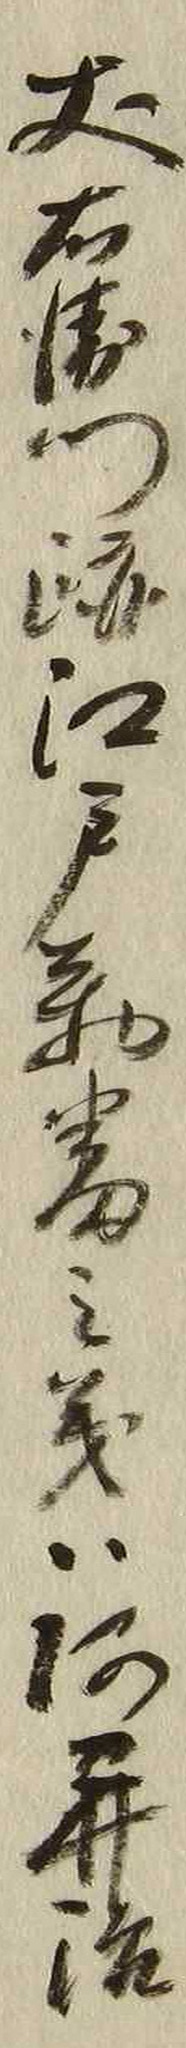丈右衛門跡江戸勤番之義は河井治
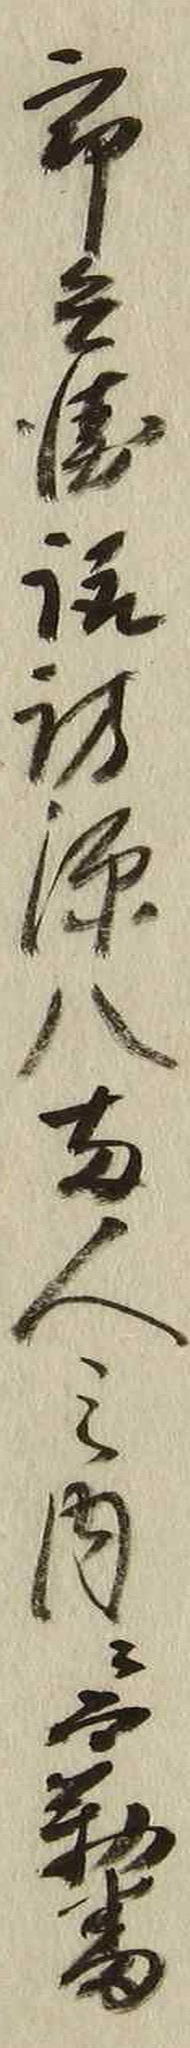市兵衛諏訪源八両人之内に而勤番
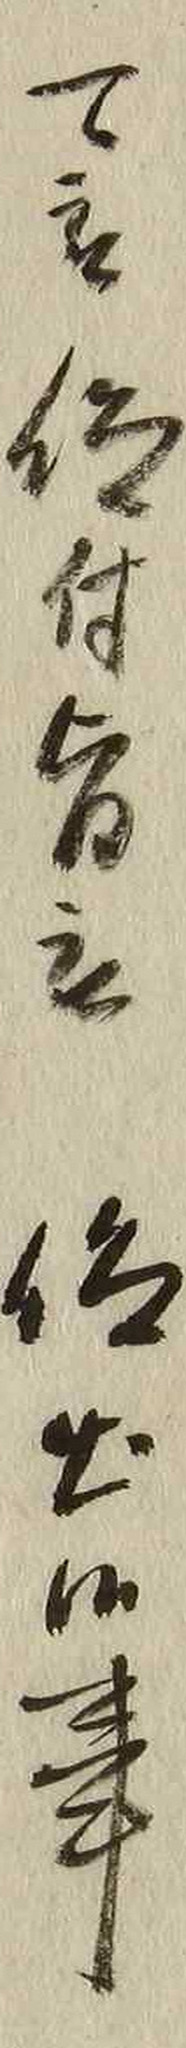可被仰付旨被仰出候事
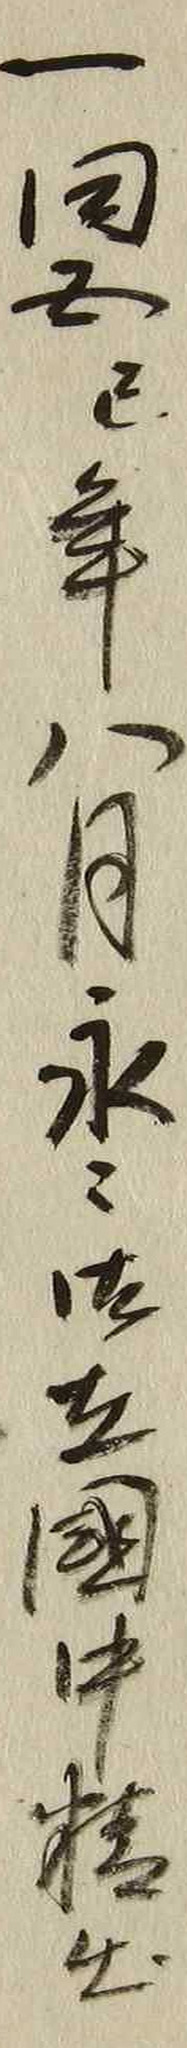一同五巳年八月永々御在国中精出
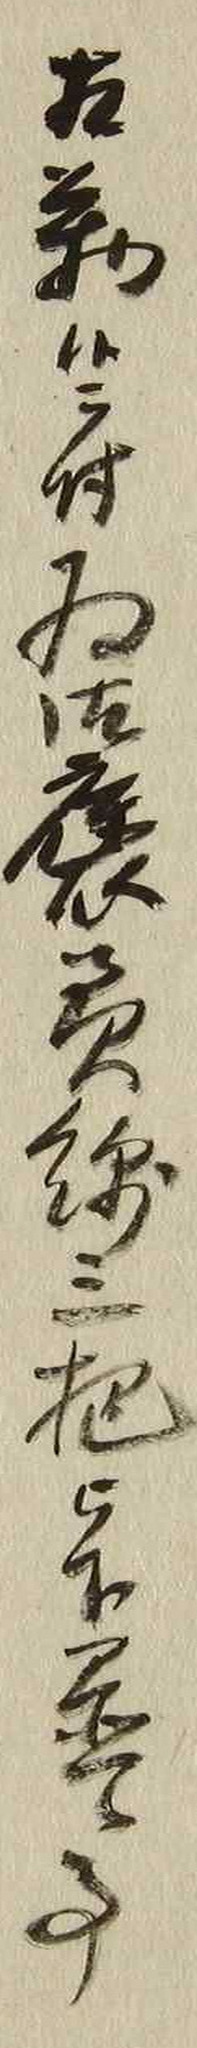相勤候に付為御褒美綿三把被下置候事
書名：諸士系譜　巻之360　す之部10
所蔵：会津若松市立会津図書館
